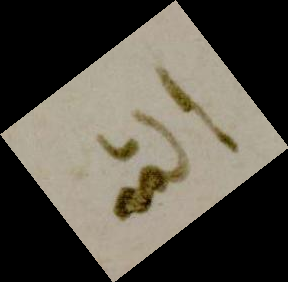الله
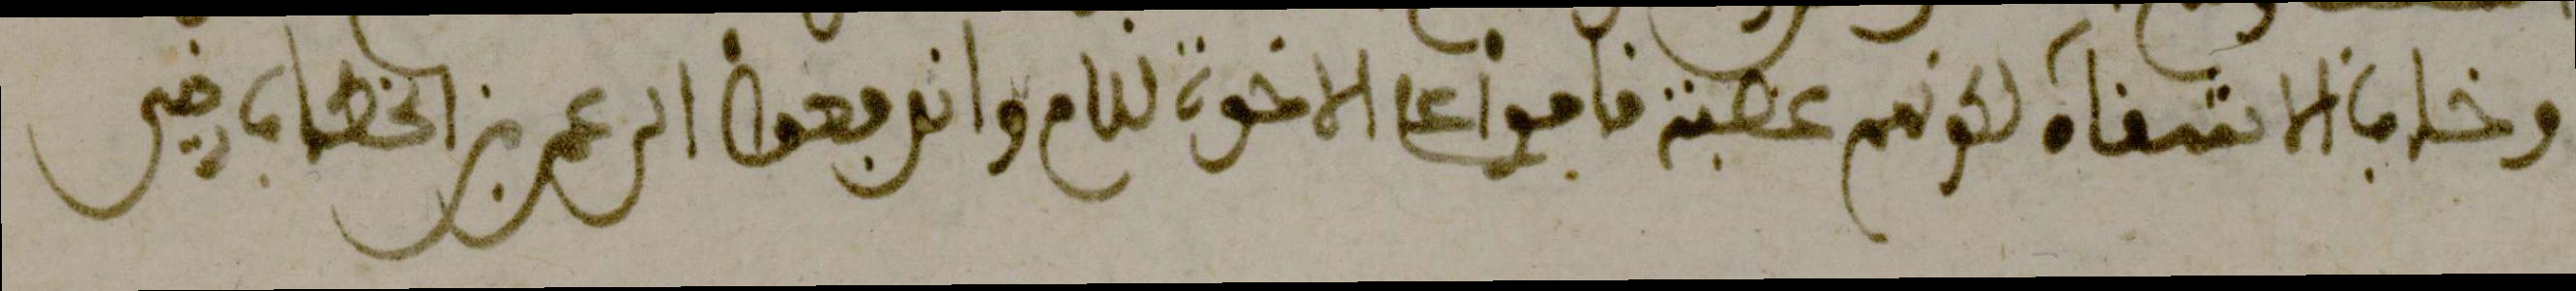وخاب الاشقاء لكونهم عصبة قاموا على الاخوة للام واندفعوا الى عمر بن الخطاب رضي
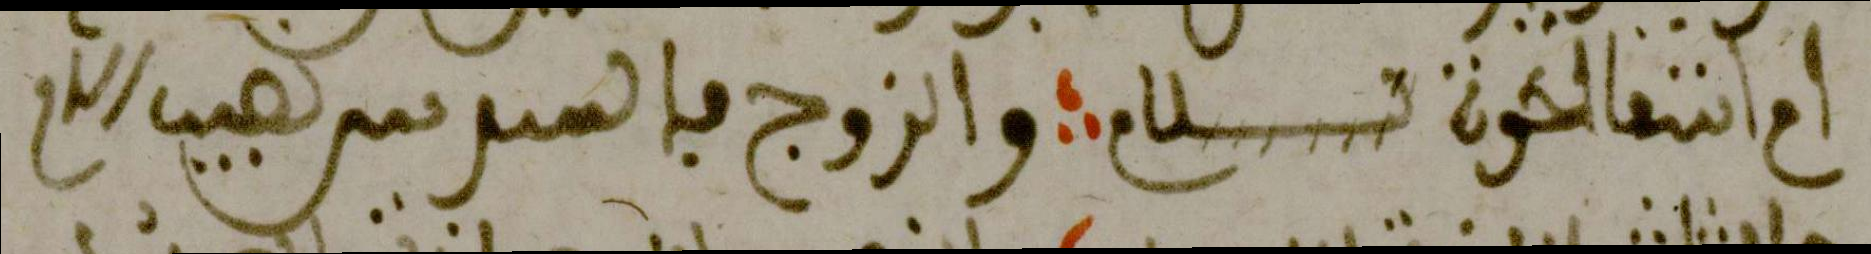ام اشقا اخوة للام والزوج فالسدس نصيب الام
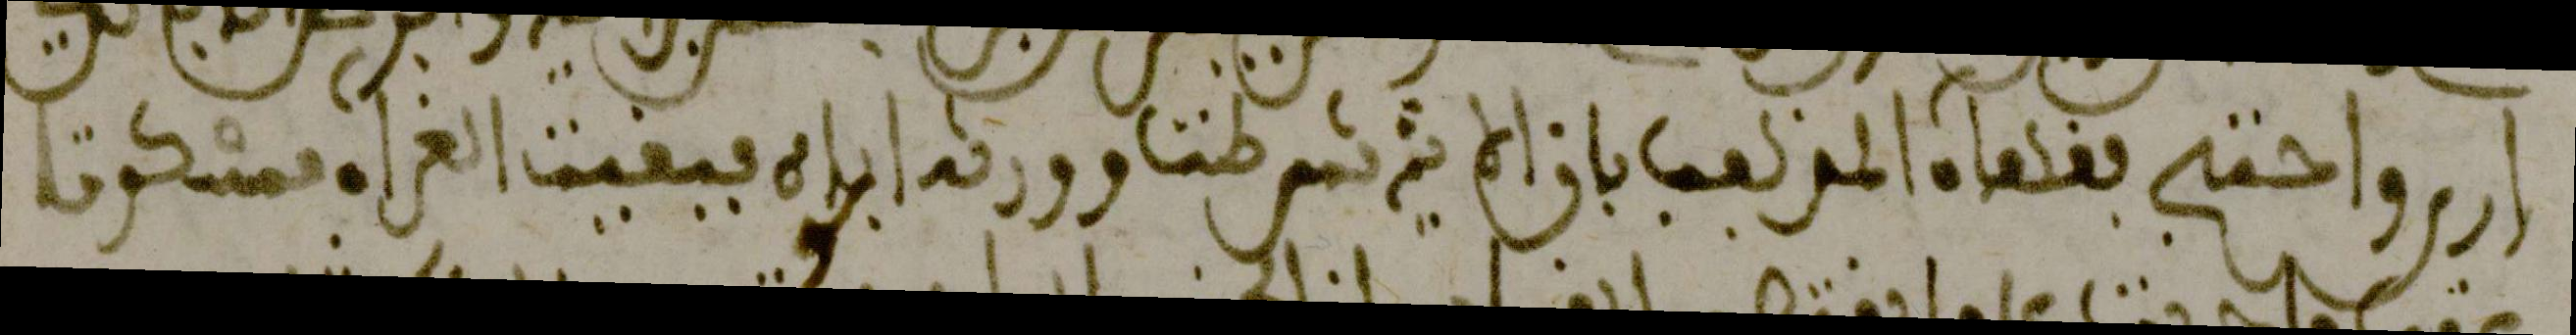ارى واحتج فقهاء المذهب بان الايمة شرطت وورثه اباه فبقيت الغراء مسْكوتا
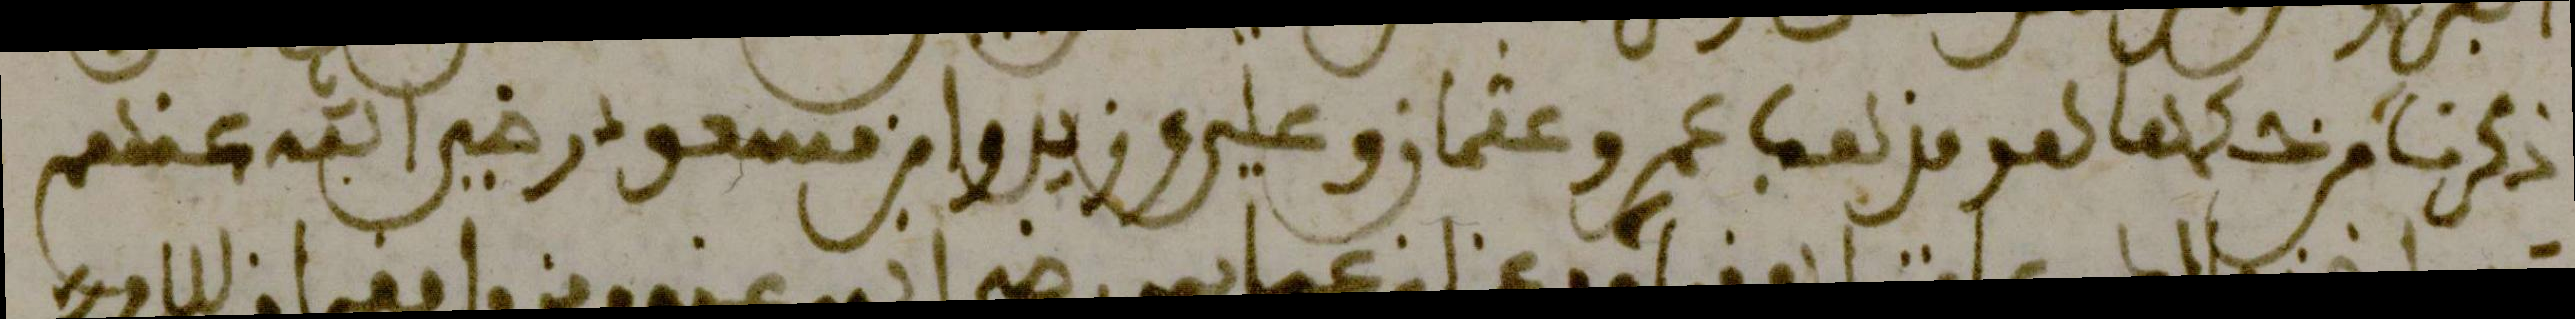ذكرنا من حكمها هو مذهب عمر وعثمان وعلي وزيد وابن مسعود رضي الله عنهم
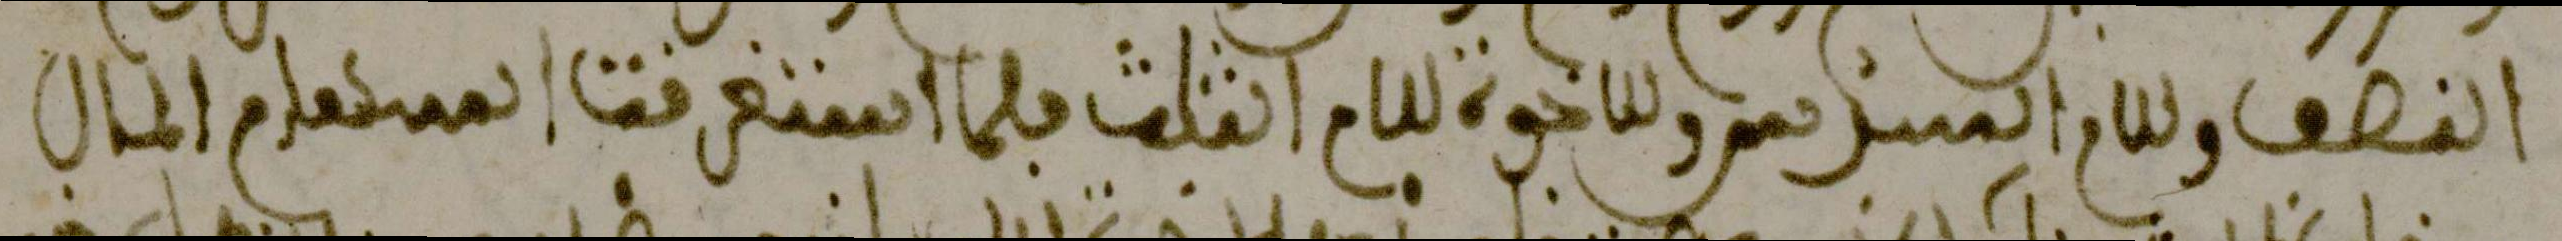النصب وللام السدس وللاخوة للام الثلث فلما استغرقت السهام المال
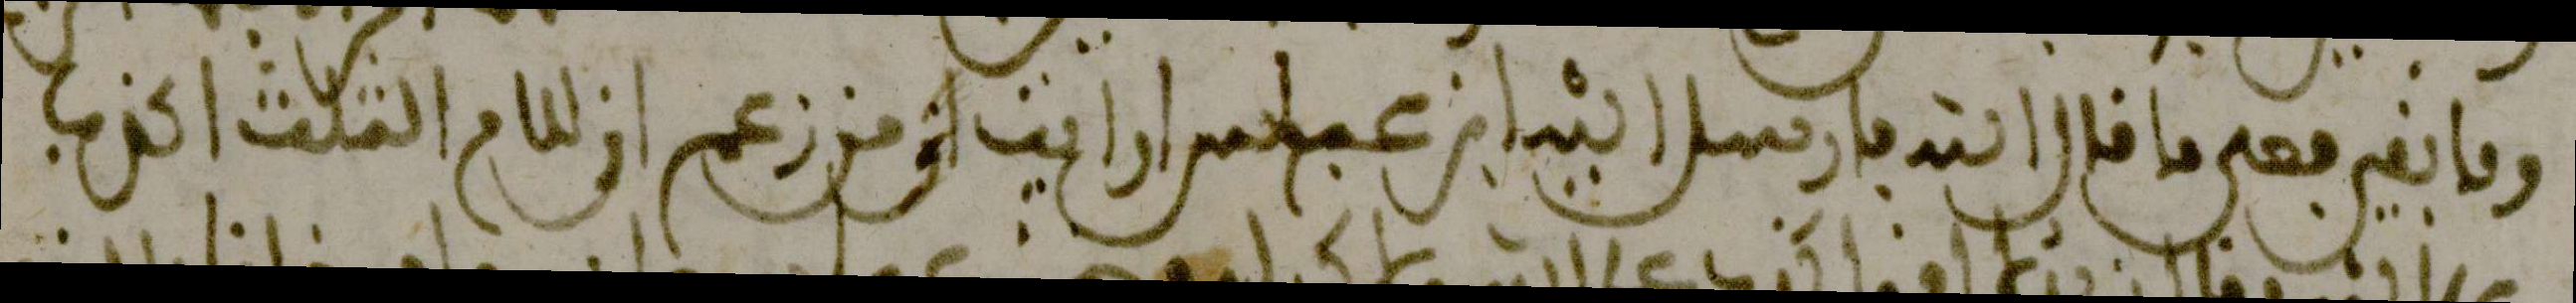وما بقي فعلى ما قال الله فارسل اليْه ابن عباس ارايت ان من زعم ان للام الثلث اكذب
